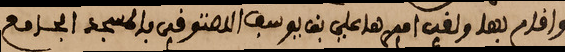واقام بها ولقي اميرها علي بن يوسف اللمتوقي بالمسجد الجامع
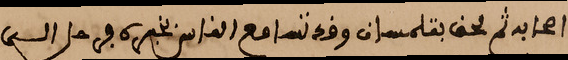اصحابه ثم لحق بتلمسان وقد تسامع الناس بخبره فرحل الى
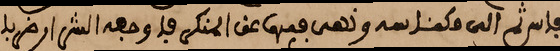فاس ثم الى مكناسه ونهى فيها عن المنكر فاوجعه الشرار ضربا
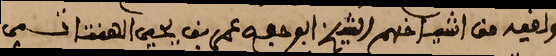ولقيه من اشياخهم الشيخ ابو حفص عمر بن يحيى الهنتاتي
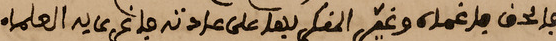فالحق باغماه وغير المنكر بها على عادته فاغرى به العلماء
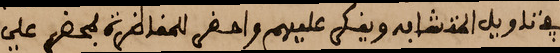في تاويل المتشابه وينكر عليهم واحضر للمناظرة بمحضر علي
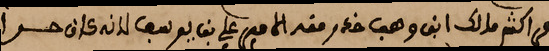مراكش مالك ابن وهب حذر منه الامير علي بن يوسف لانه كان حرا
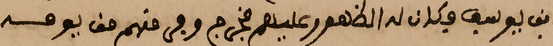ابن يوسف فكان له الظهور عليهم فخرج وفرقهم من يومه
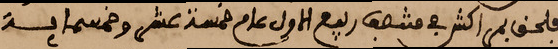فلحق بمراكش في منتصف ربيع الاول عام خمسة عشر وخمسماية
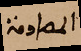المصادمة
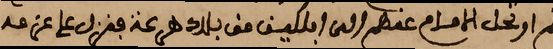ثم ارتحل الامام عنهم الى ابلكين من بلاد هرعة فنزل على عزمه
